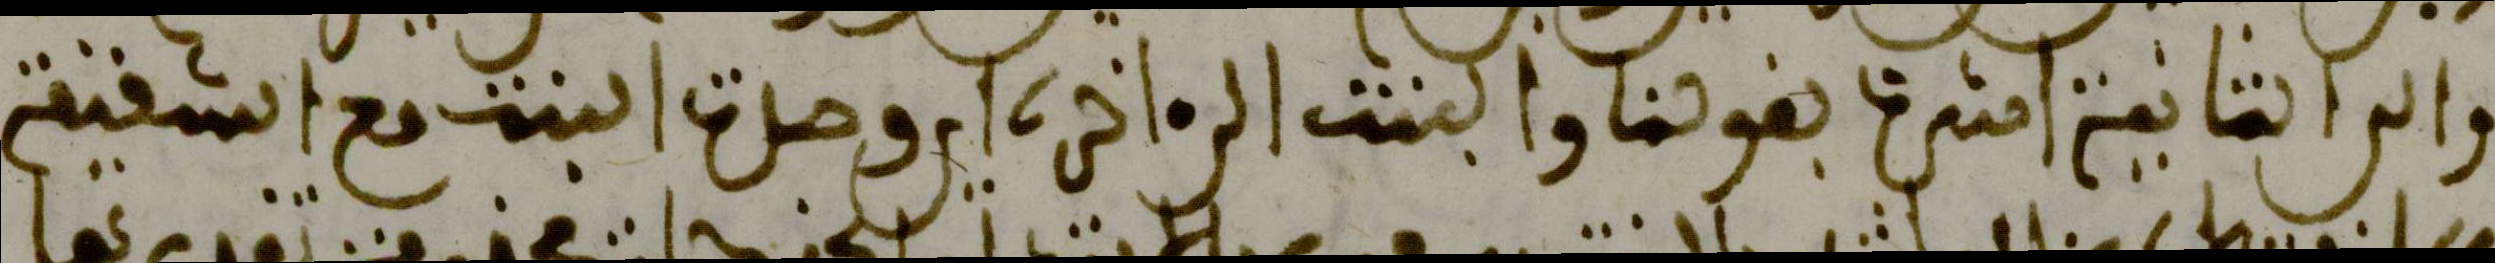والى الثانية اشرن بقولنا والبنت الى ءاخره اي وصدت البنت مع الشقيقة
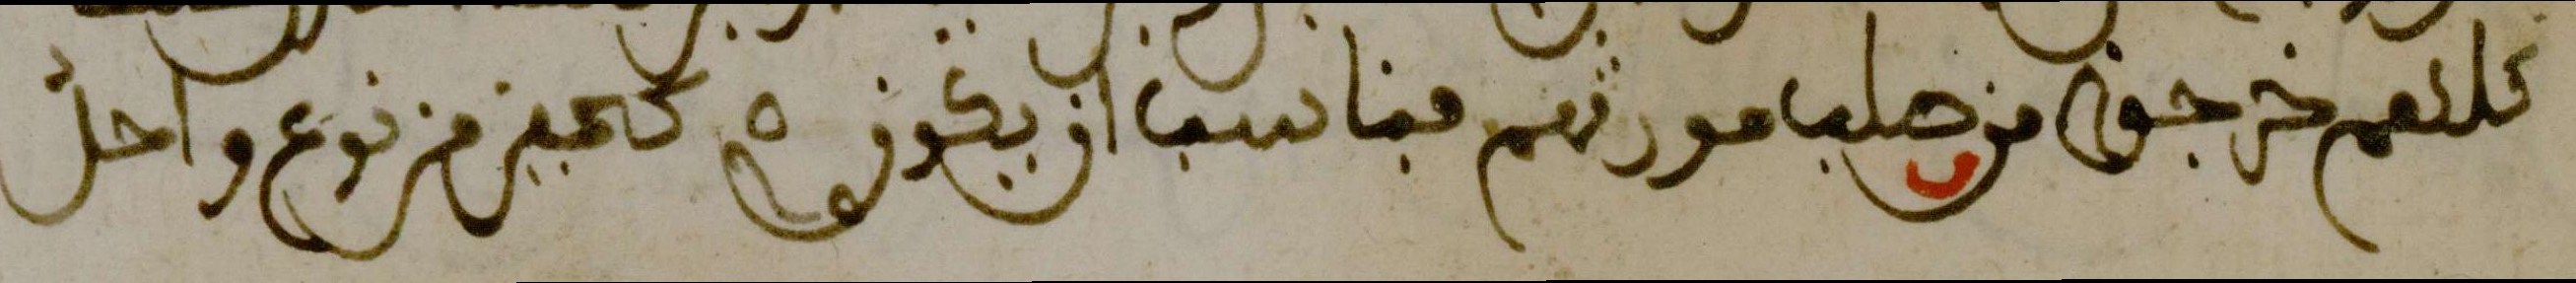كلهم خرجوا من صلب مورثها فناسب ان يكون كحيز من نوع واحد
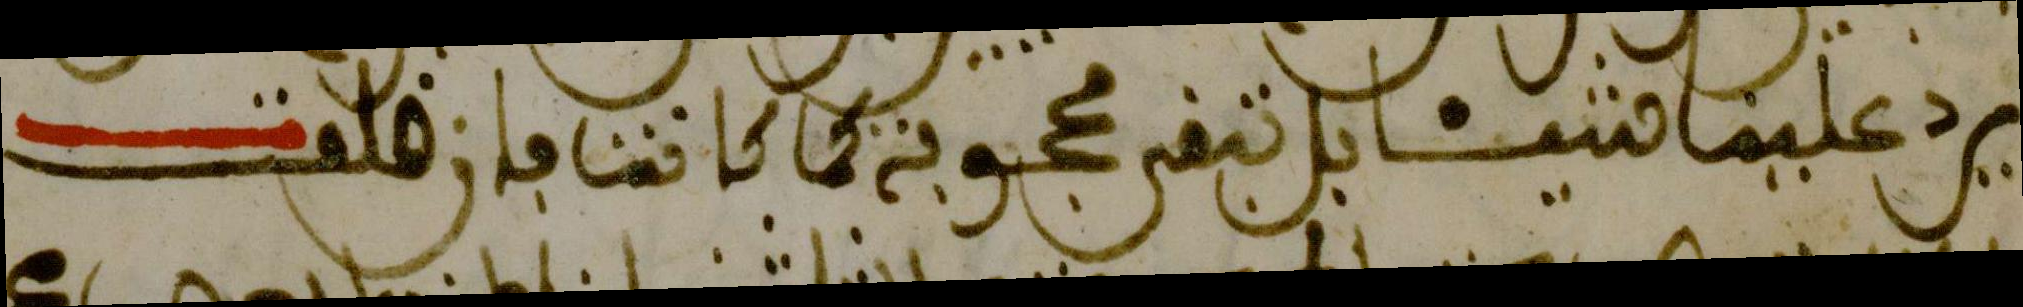يرد عليها شيأ بل تبقى محجوبة كما كانت فان قلت
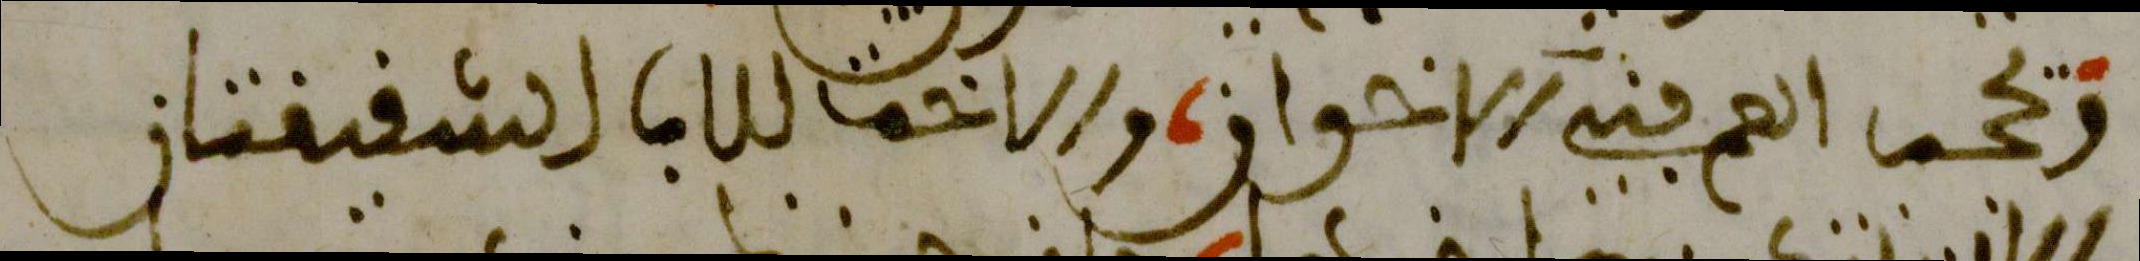ويحجب العم بني الاخوان والاخت للاب الشقيقتان
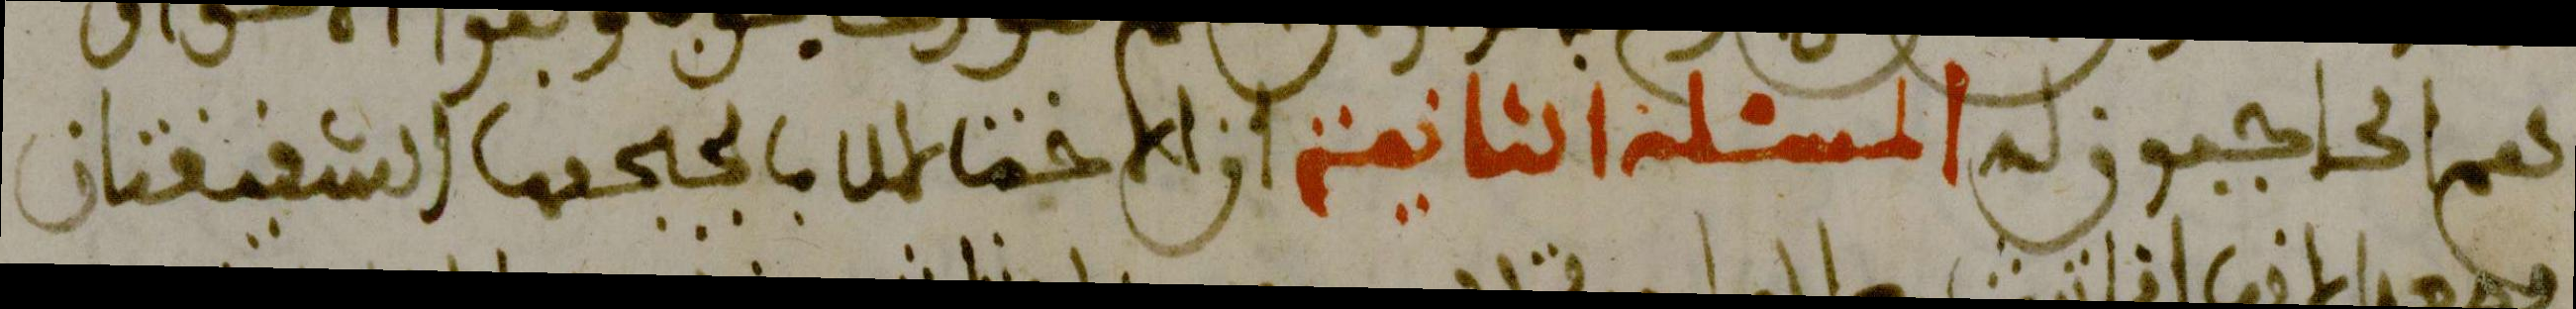هم الحاجبون له المسئلة الثانية ان الاخت للاب يحجبها الشقيقتان
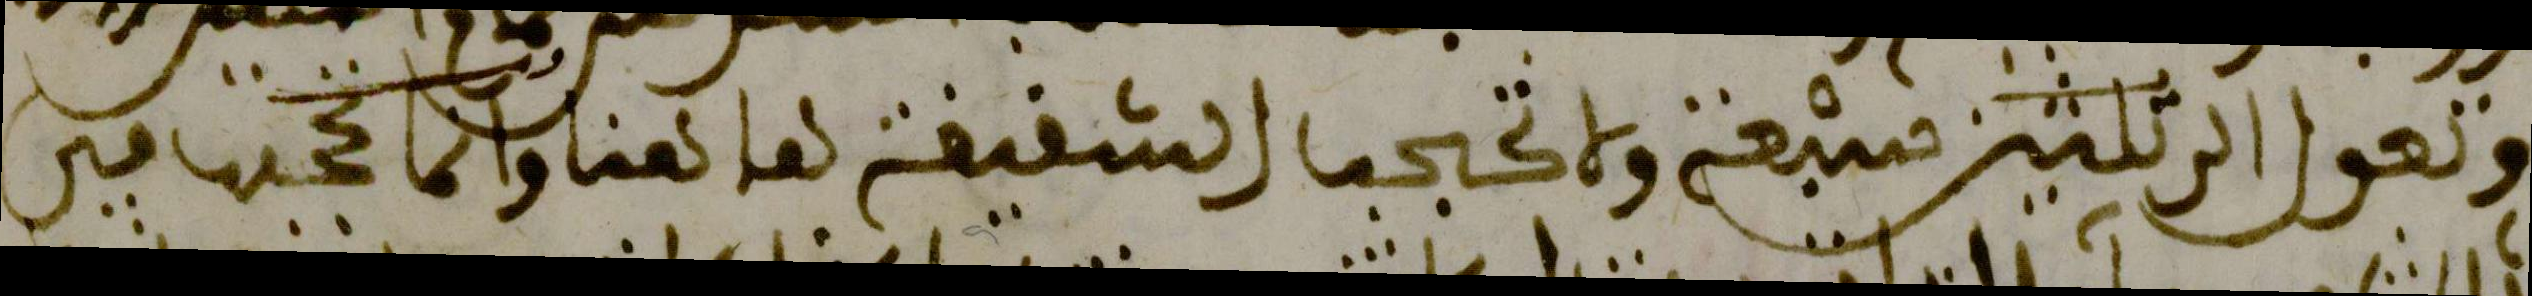وتعول الى ثلثين سبْعة ولا تحجب الشقيقة ها هنا وانما تحجبها في
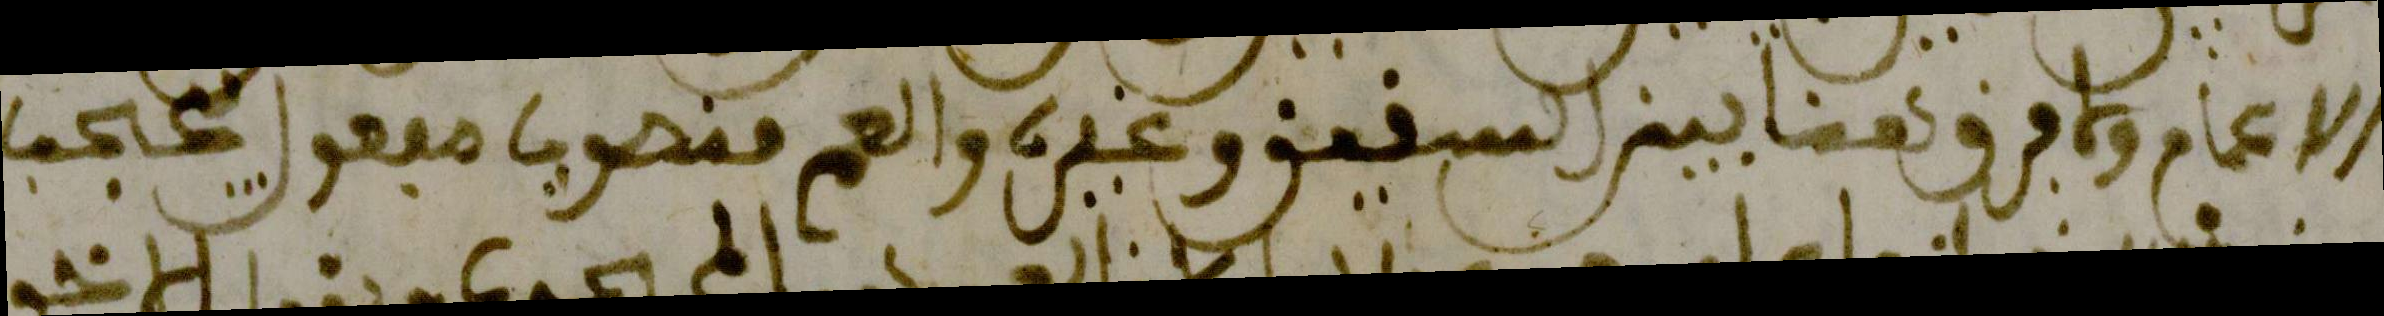الاعمام ولا فوق هنا بين السقيق وغيره والعم منصوب مفعول بيحجب
